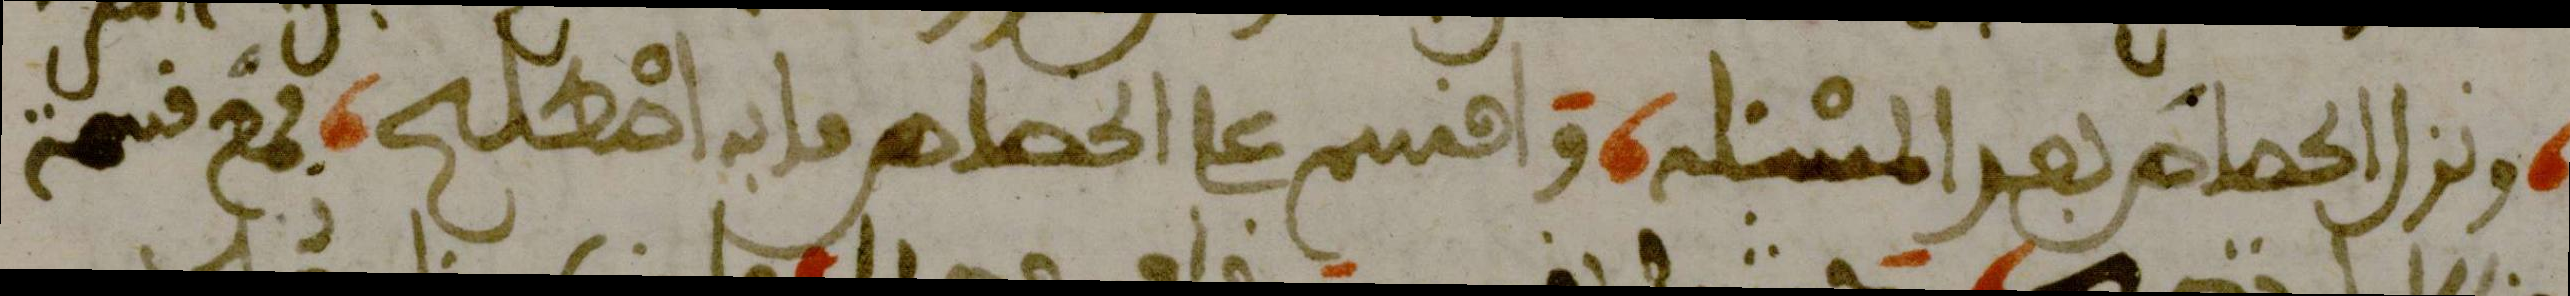ونزل الحصاص بعد المسْئلة وَاقسم على الحصاص ما به اصْطلح فمع قسمة
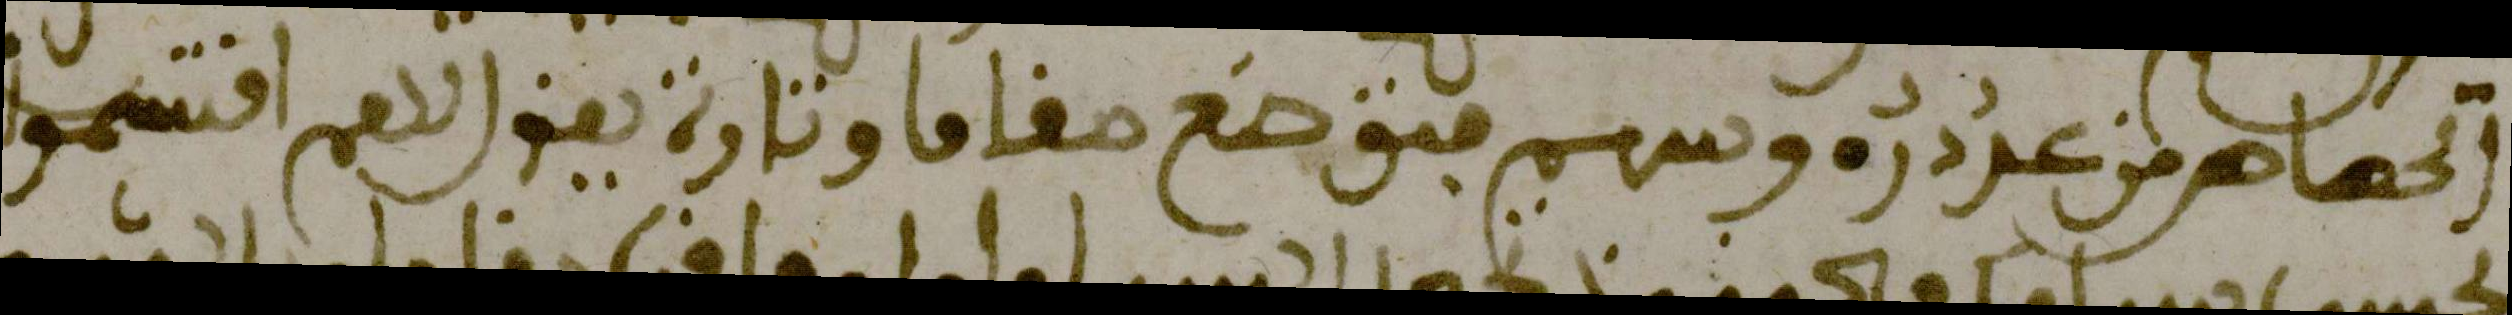الحصاص من عدد رءوسهم فتوضع مقاما وتارة يقول لهم اقتسموا
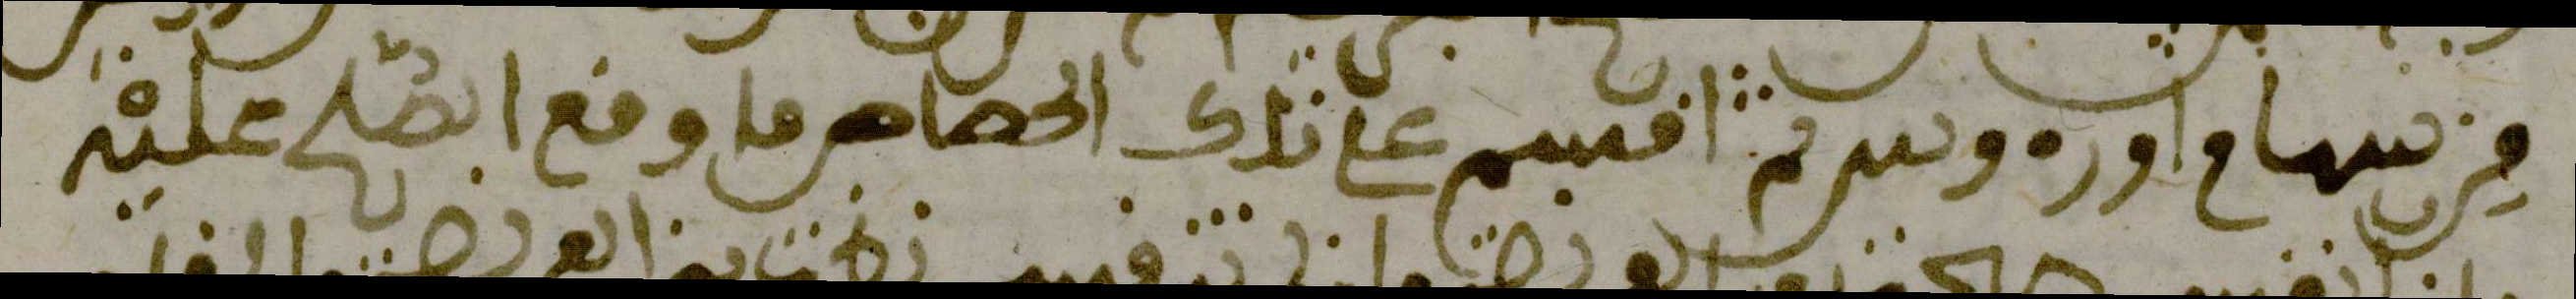مِن سهام او رءوس ثم اقسم على تلك الحصاص ما وقع الصُلح عليْه
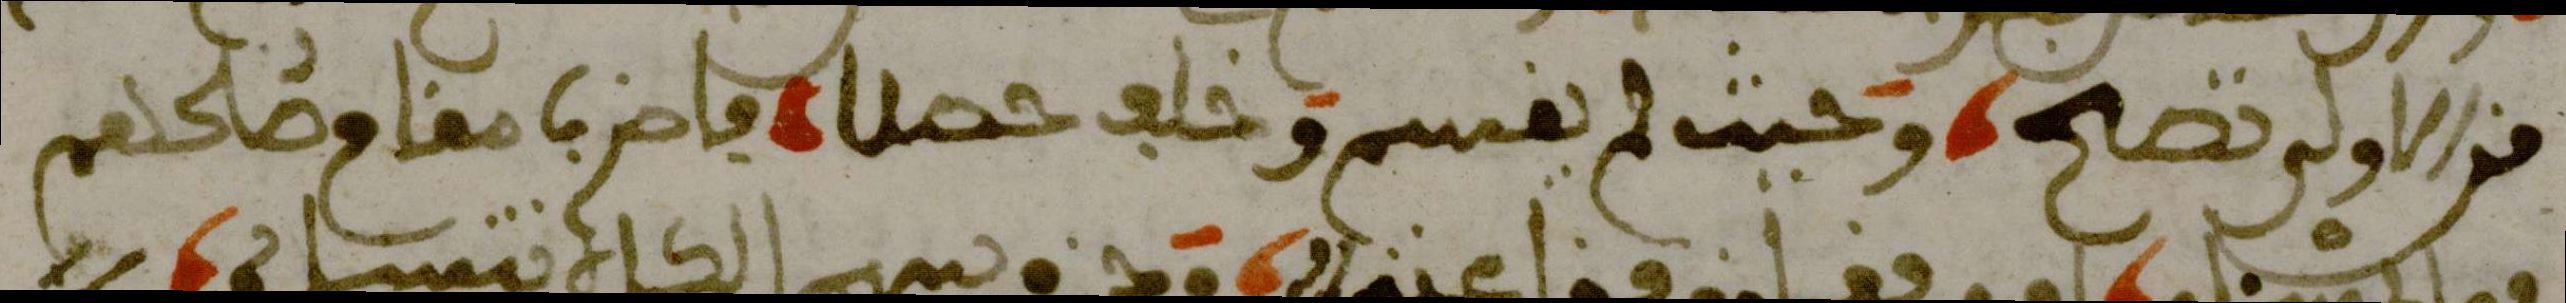من الاولى تصح وَحيث لم يقسم وَخلف حصلا فاضرب مقام صُلحهم
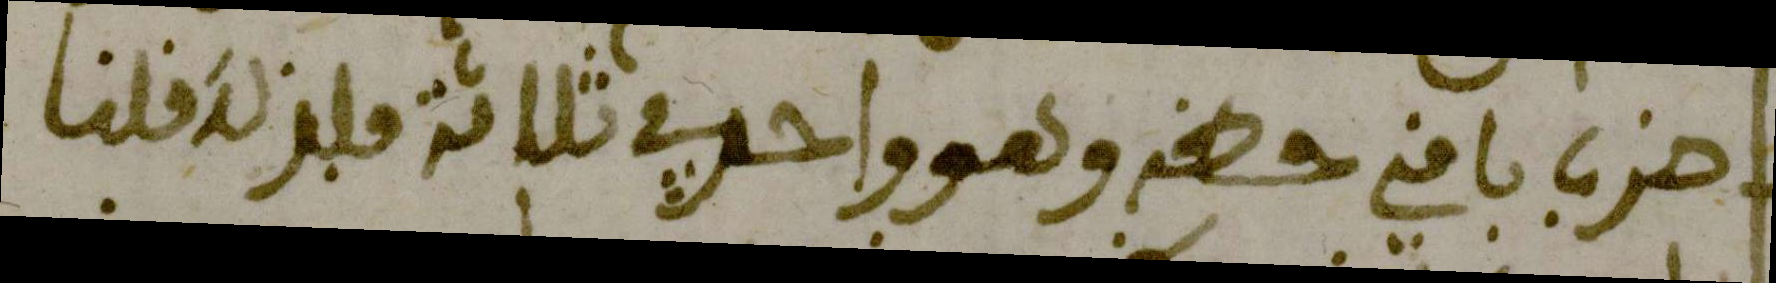ضرب باقي حضه وهو واحد في ثلاثة فلذلك قلنا
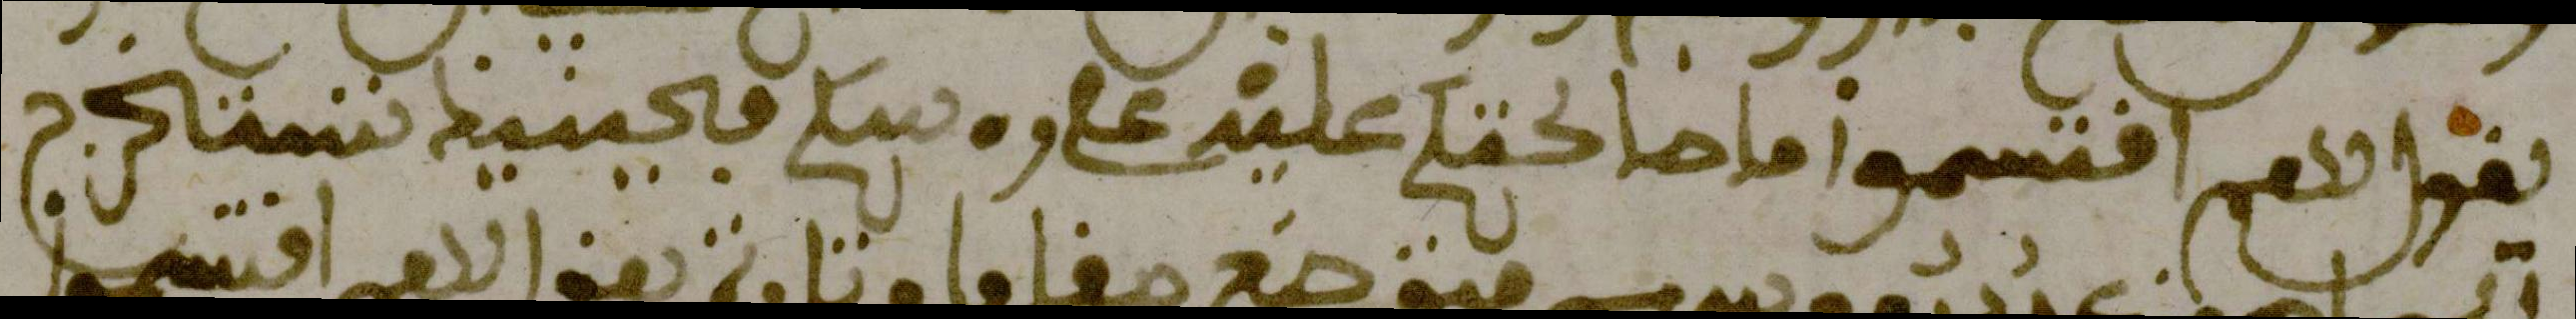يقول لهم اقتسموا ما صالحتكم عليْه على رءسكم فحينيذ تستخرج
